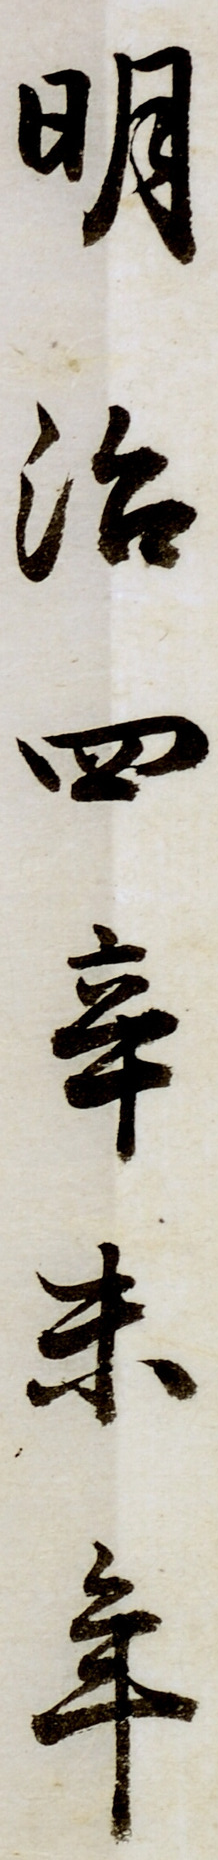明治四辛未年
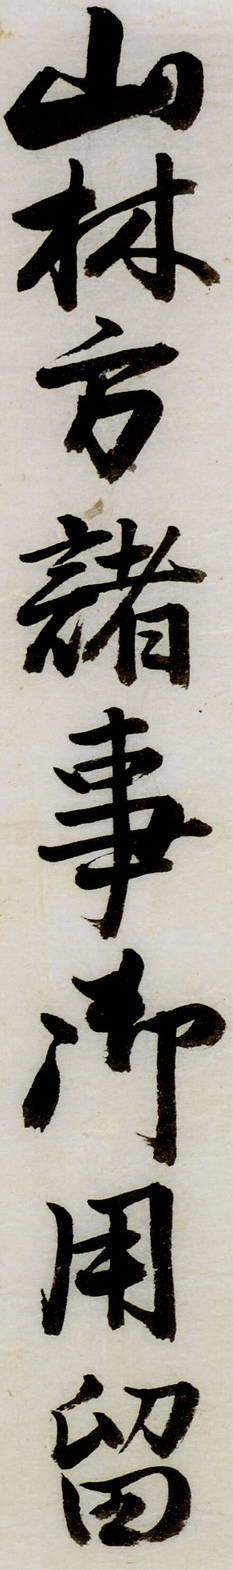山林方諸事御用留

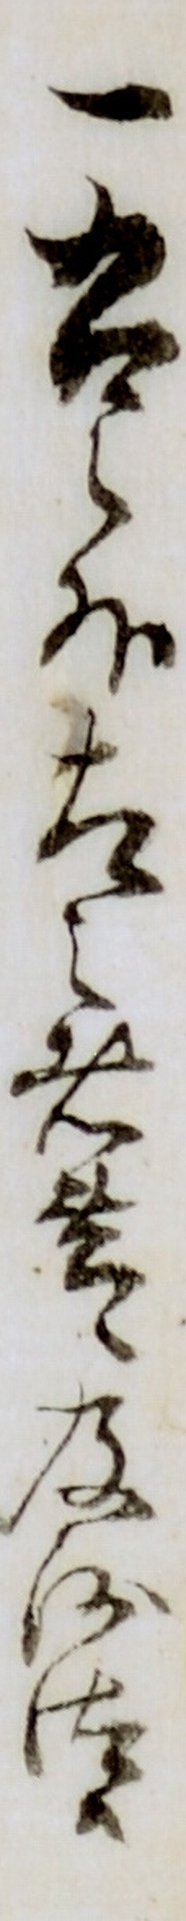一右之外左之者共へ及沙汰候
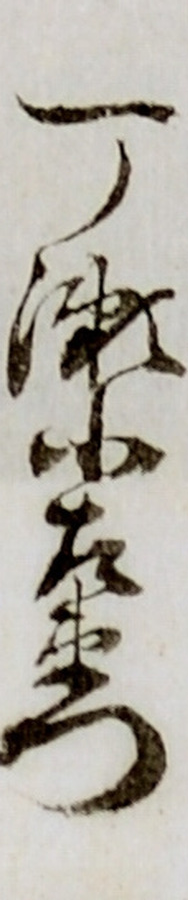一ノ瀬小左衛門
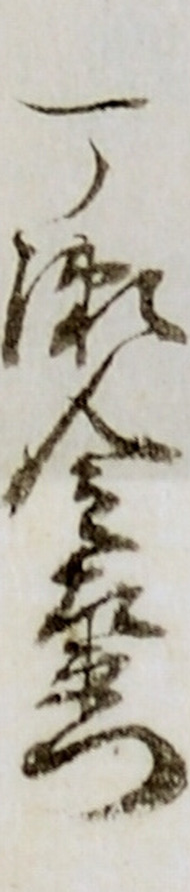一ノ瀬金左衛門
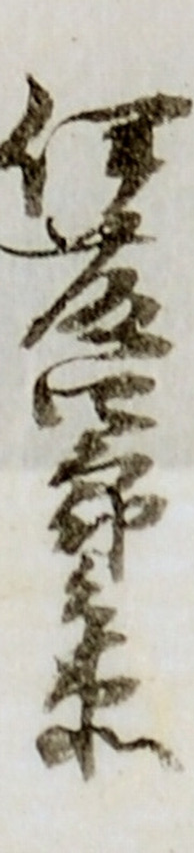伊藤四郎兵衛
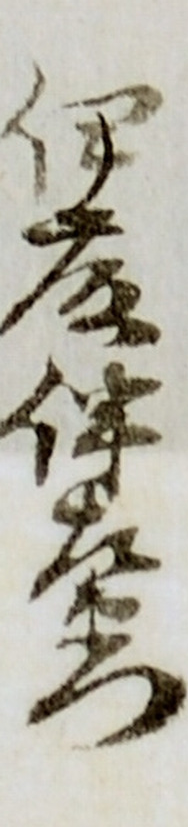伊藤伴左衛門
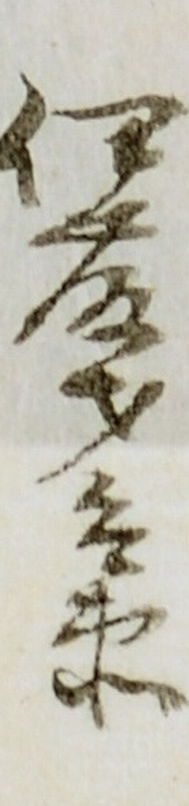伊藤才兵衛
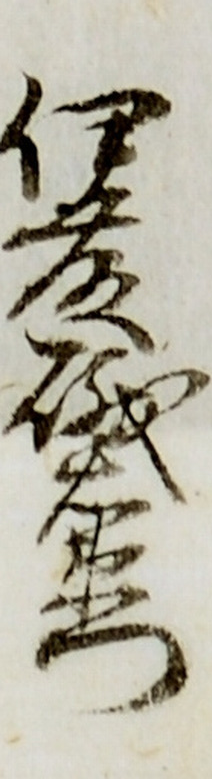伊藤磯右衛門
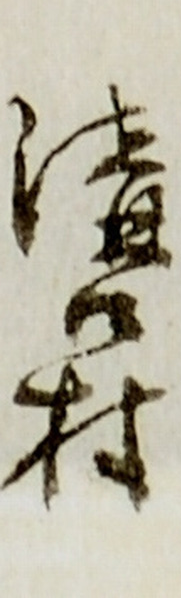溝口村
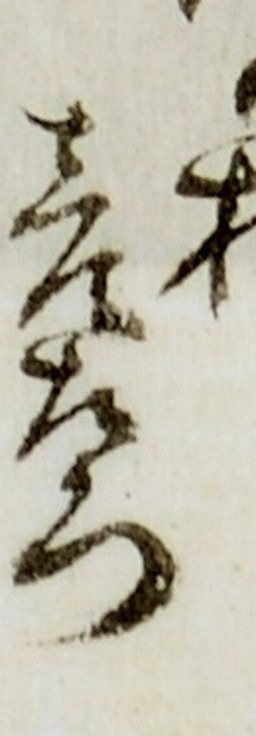彦左衛門
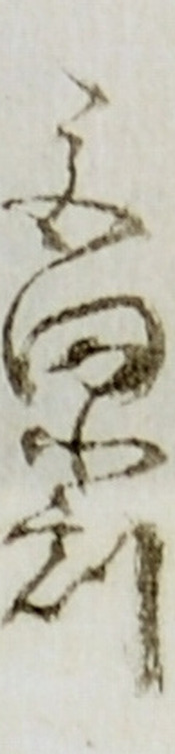宮田北割
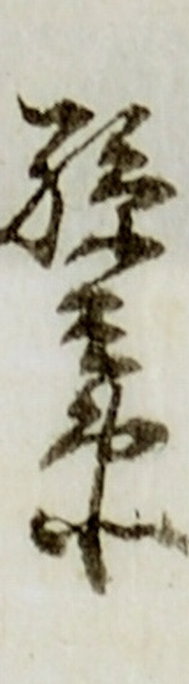孫兵衛
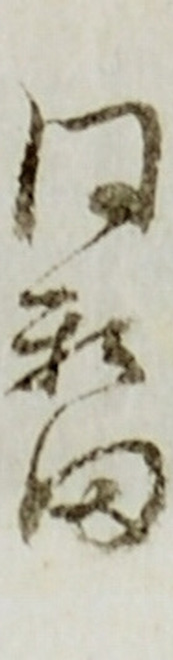同新田
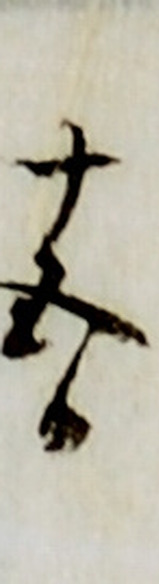十五日
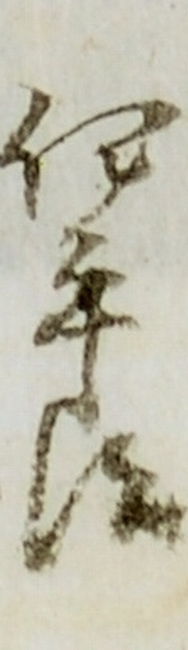伊平治
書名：山林方諸事御用留
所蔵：伊那市立高遠町図書館・合同会社AMANE
